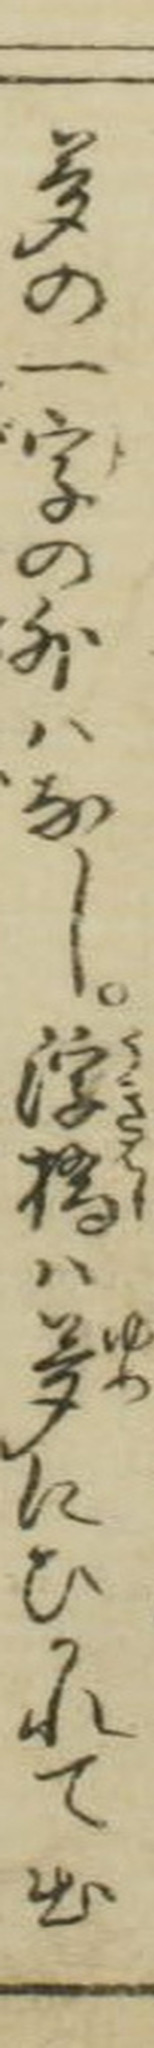夢の一字の外はなし。浮橋は夢にひかれて出
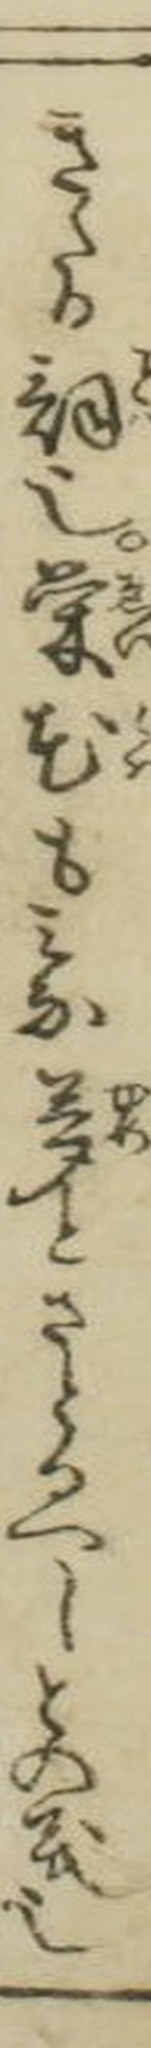きたる詞也。栄花もみな夢とさとるへしとの義也
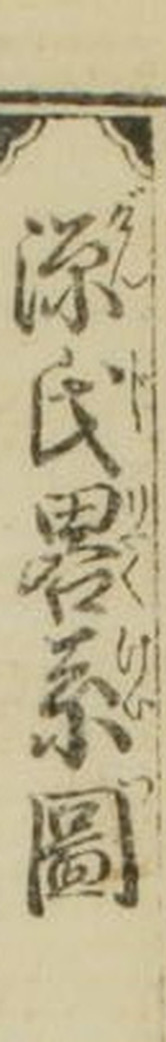源氏略系図
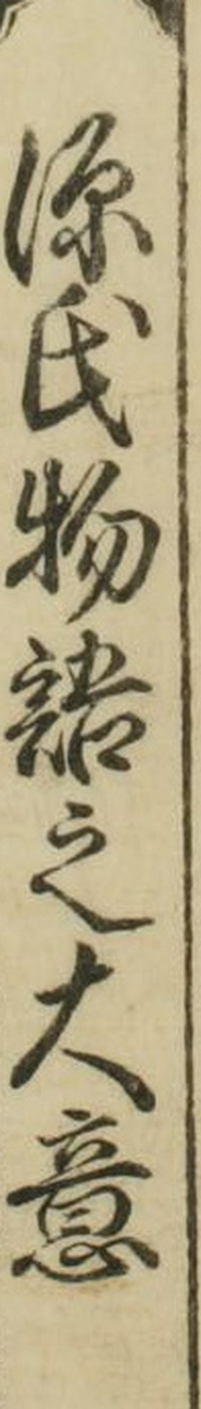源氏物語之大意
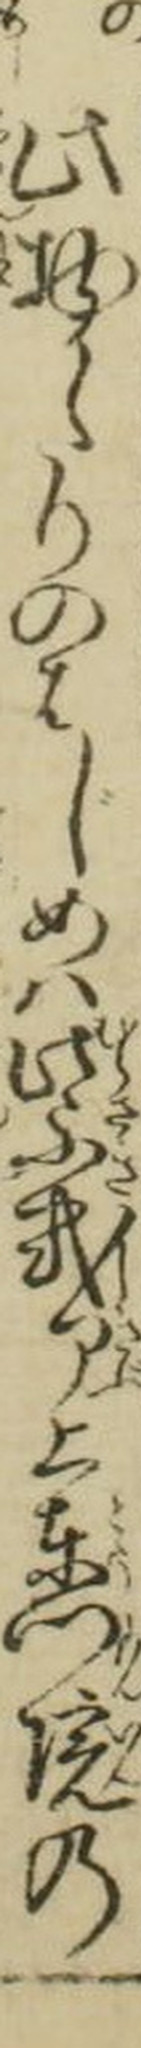此物かたりのはじめは紫式部上東門院の
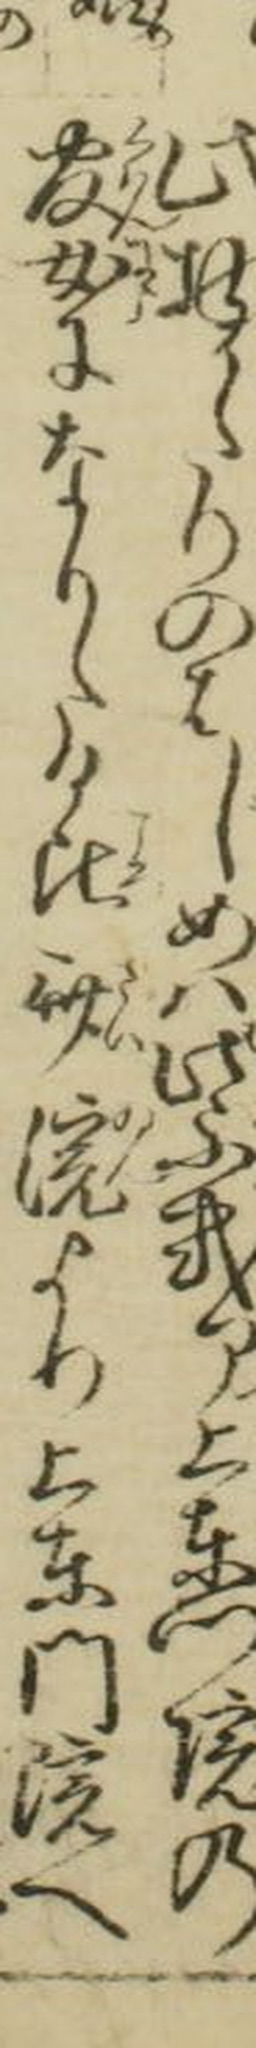官女になりたる比斎院より上東門院へ
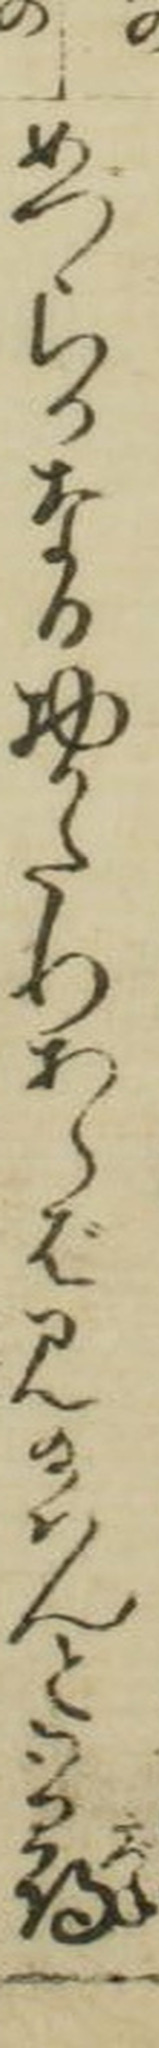めづらかなる物かたりあらば見給はんと御尋
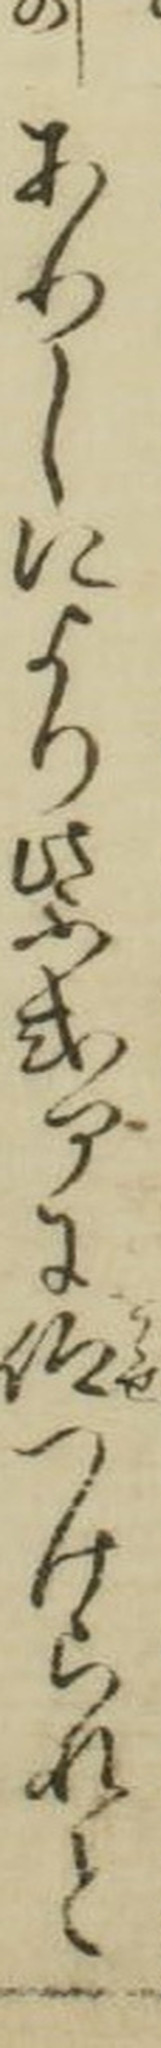ありしにより紫式部に仰つけられと
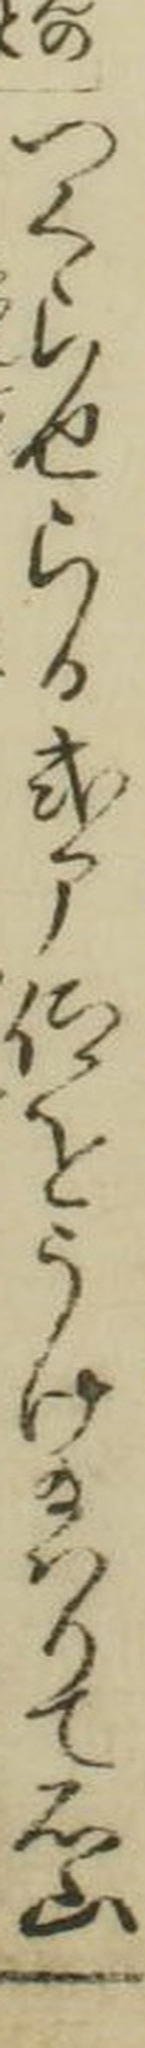つくらせらる式部仰をうけ給はりて石山
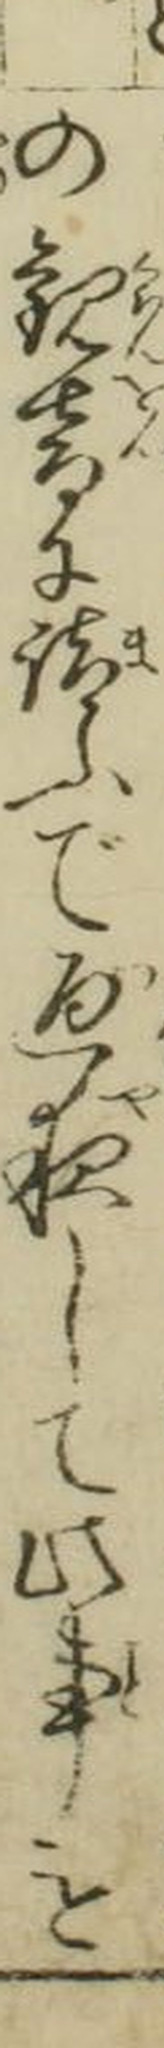の観音に詣ふで通夜して此事を
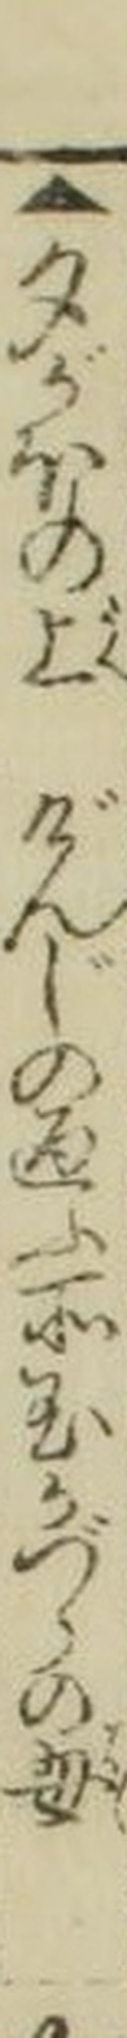▲夕がほの上げんじの通ふ所玉かづらの母
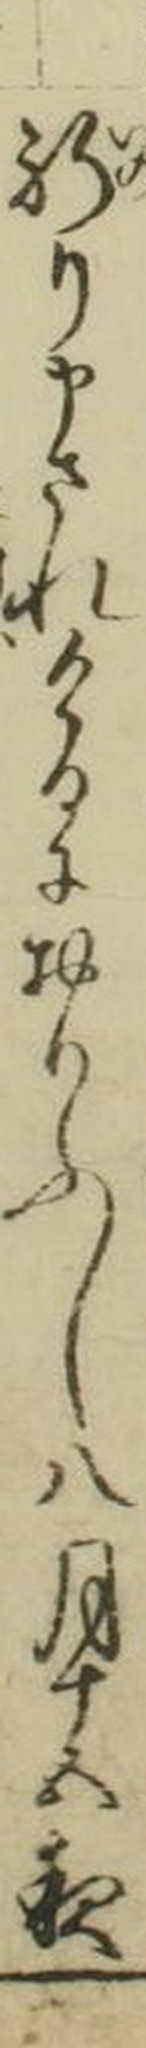祈り申されけるにおりふし八月十五夜
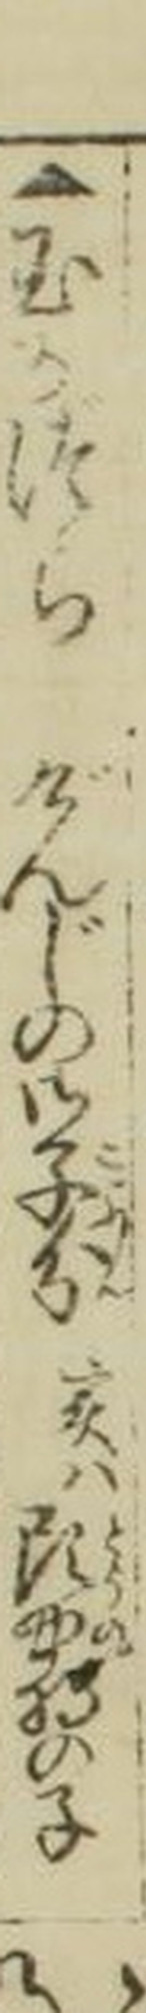▲玉かつらげんじの御子分実は頭中将の子
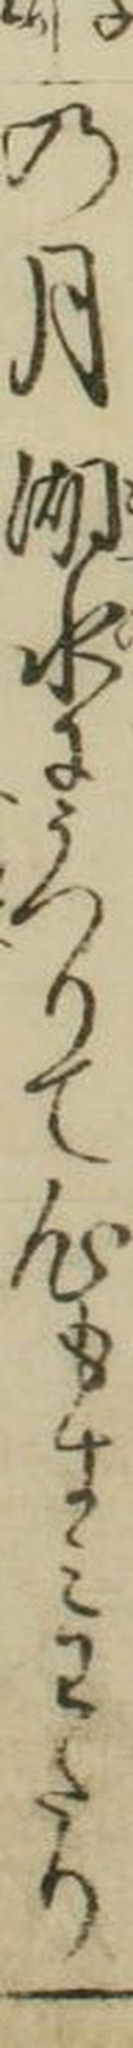の月湖水にうつりて心もすみわたり
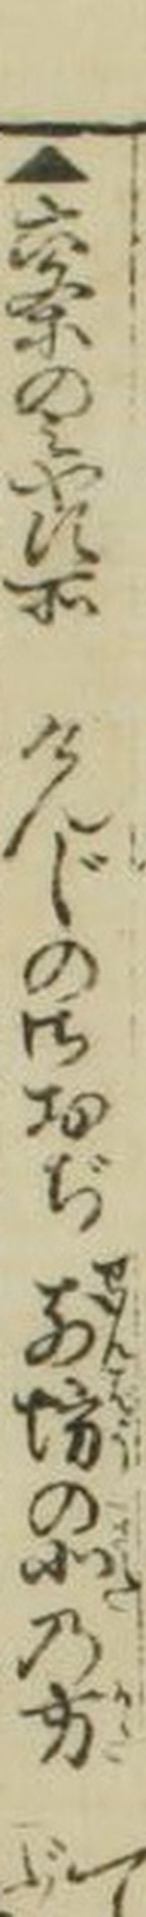▲六条のみやす所げんじの御おぢ前坊の北の方
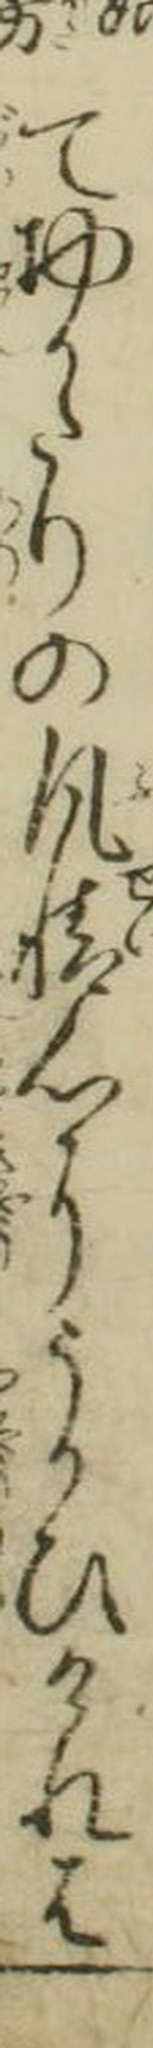て物かたりの風情心にうかひけれは
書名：女源氏教訓鑑
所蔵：東京学芸大学附属図書館
